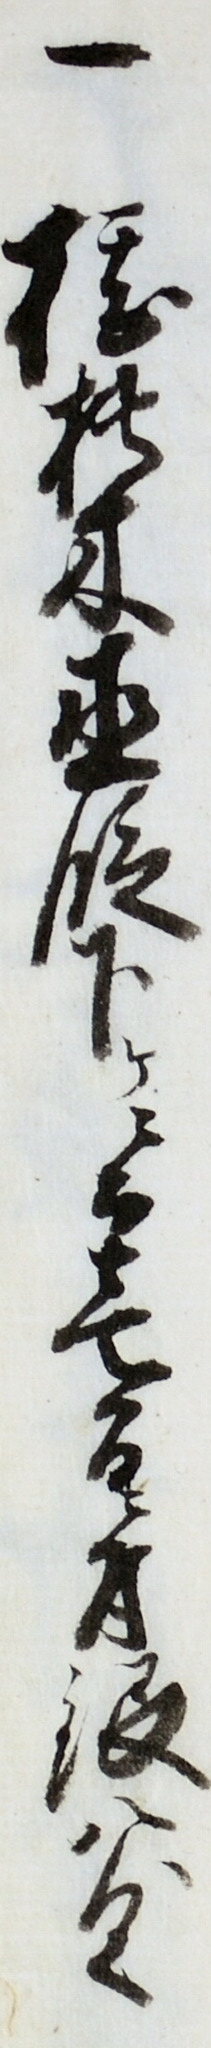一椹樽木直段下ヶニ而壱百ニ付銀八匁
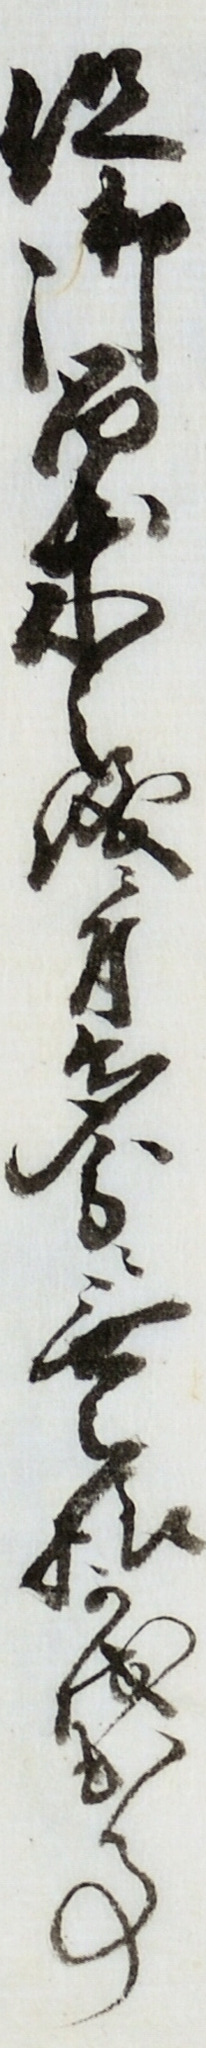但御留木之儀ニ付多分ニ無之様可伐出事
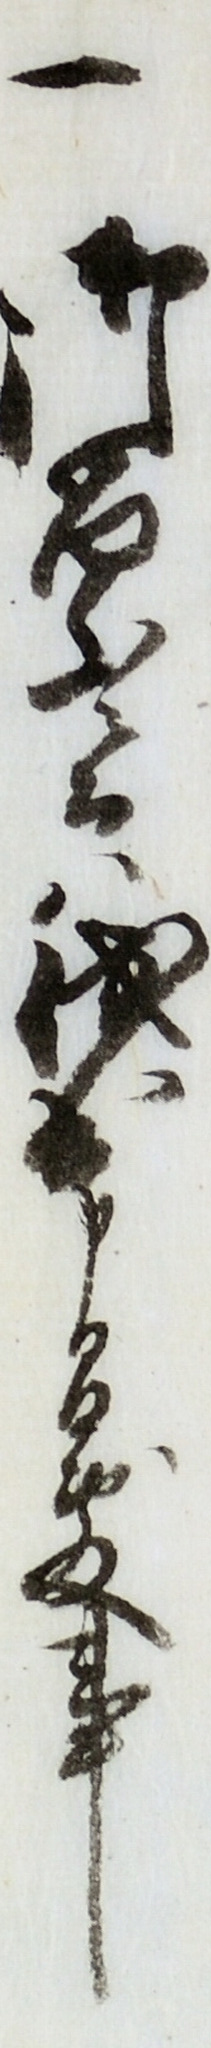一御留不ニ而ハ伐出申間敷事
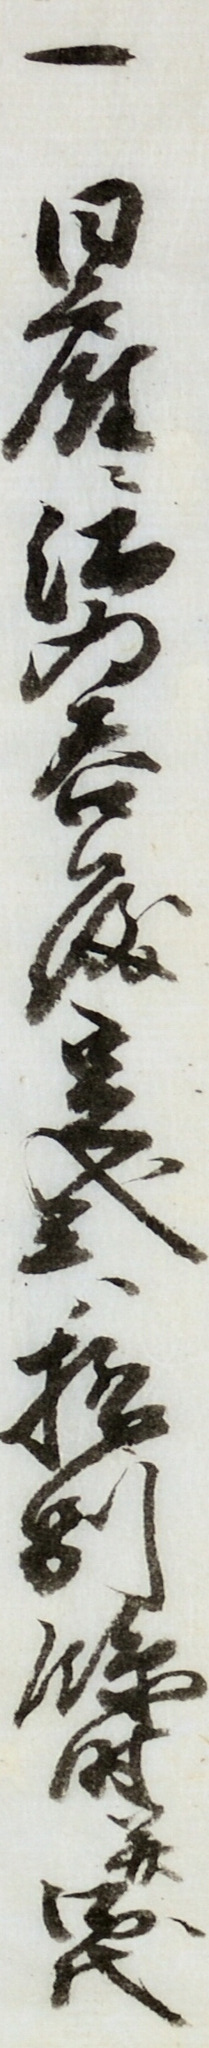一日雇ニ酒為呑候儀定式ハ格別臨時并酒代
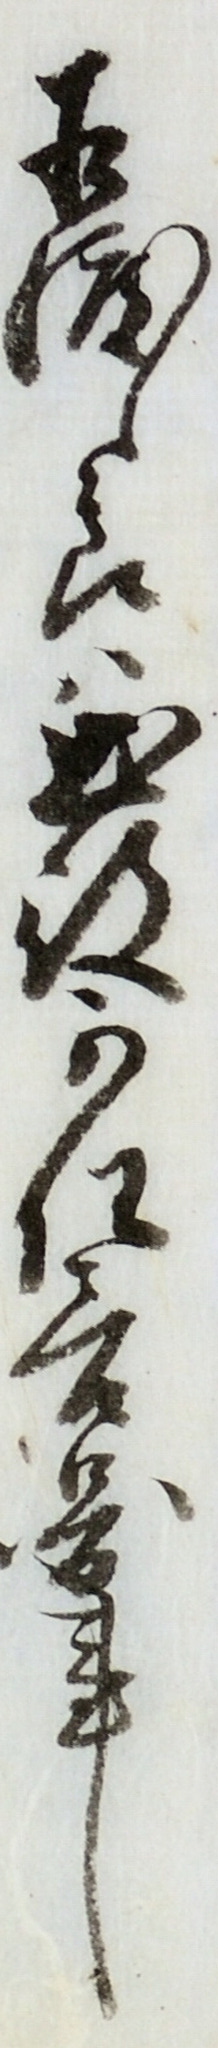相渡候節ハ出役可仕差図事
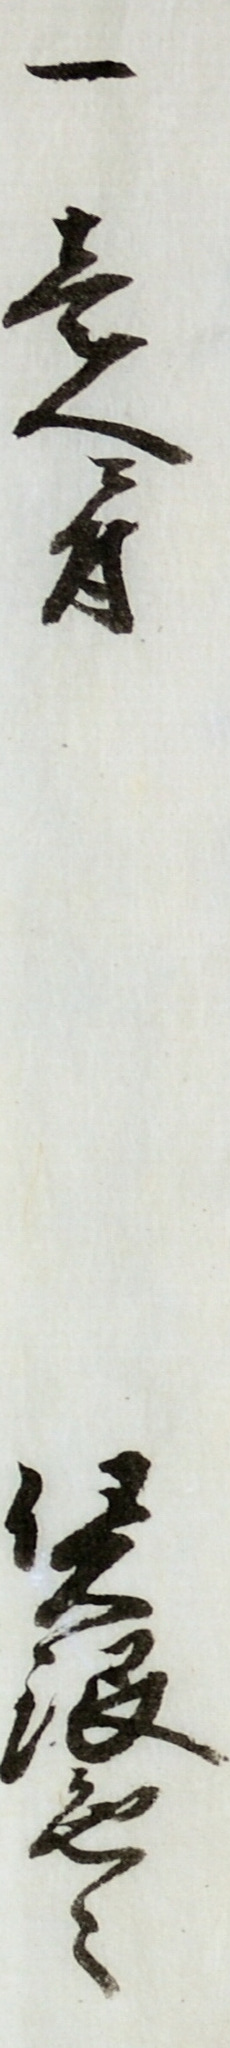一壱人ニ付賃銀色々
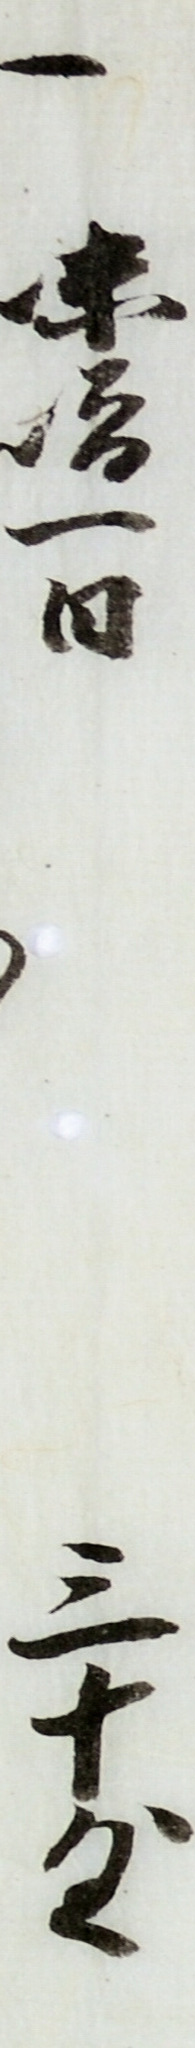一味噌一日三十匁

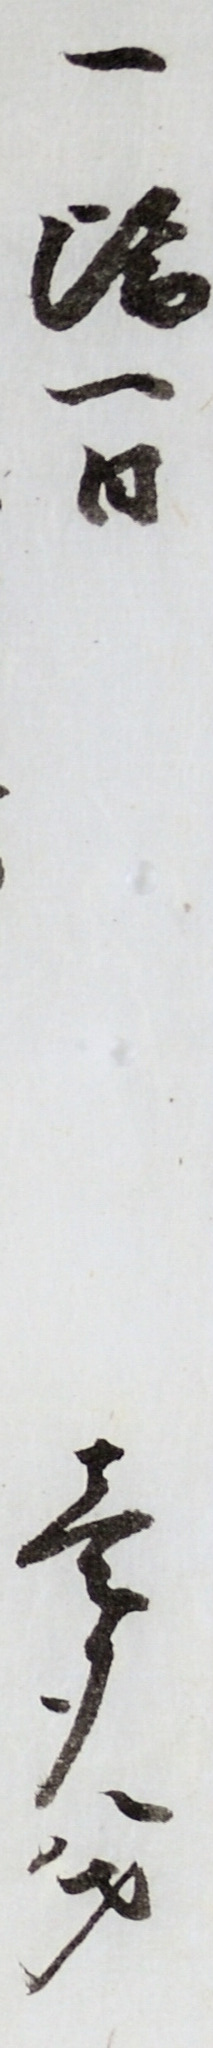一皆一日壱勺八才
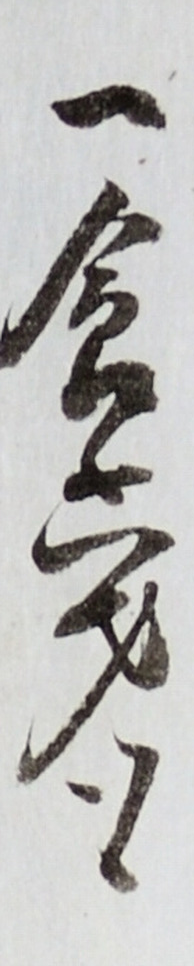一食六才ツヽ
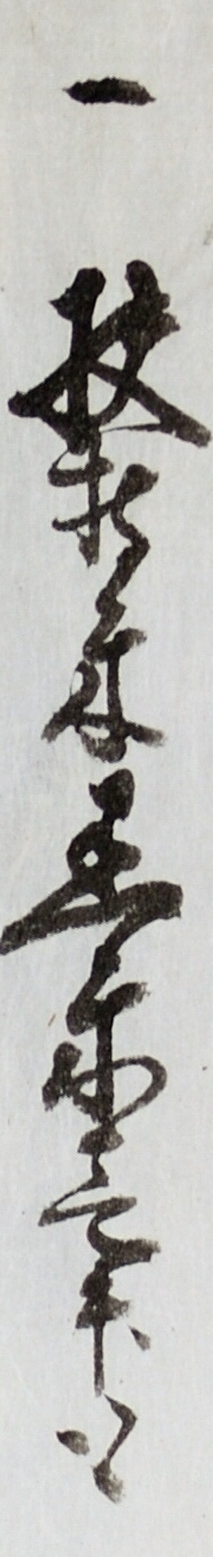一扶持米黒米壱升ツヽ
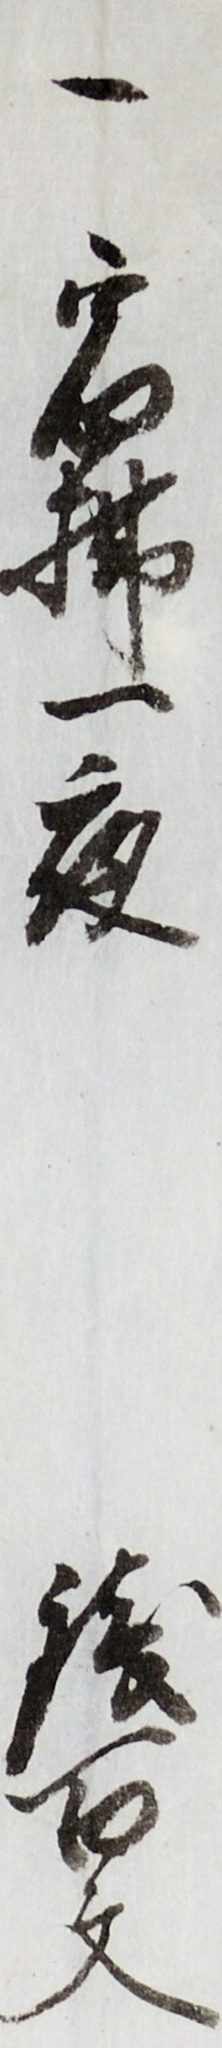一宿払一夜銭百文
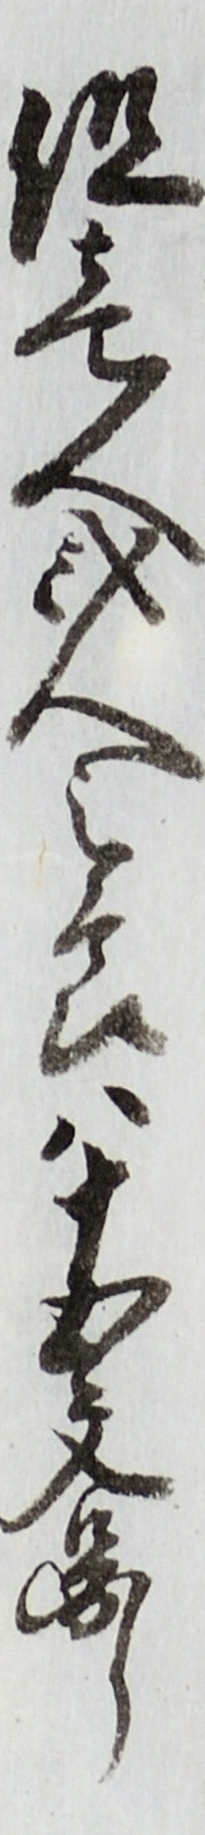但壱人弐人之節ハ十五文図り
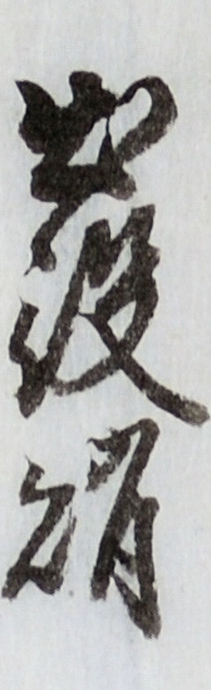出役硝
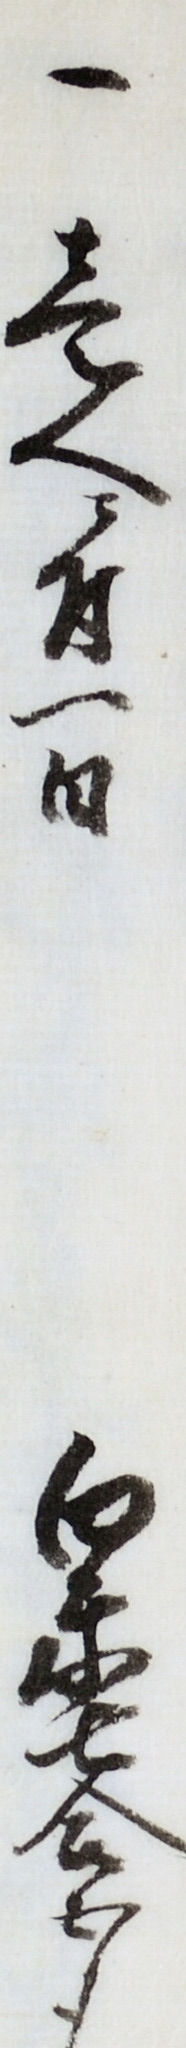一壱人ニ付一日白米七合五勺
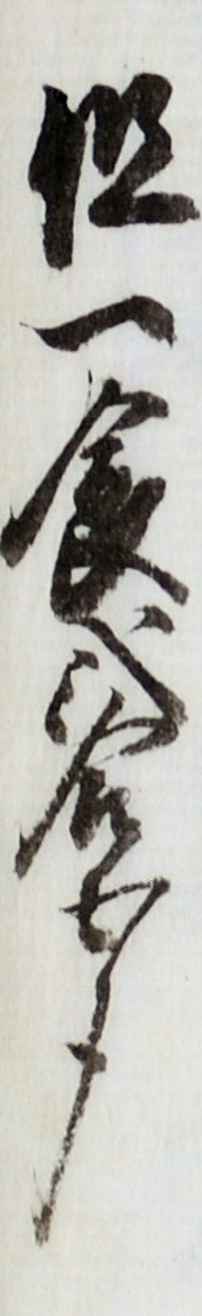但一食弐合五勺
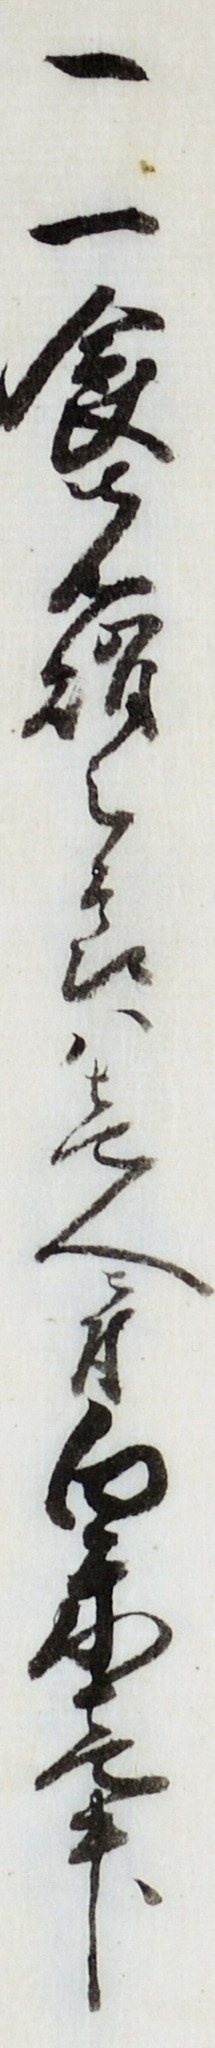一一食先硝之節ハ壱人ニ付白米壱升
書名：御薪方掟控
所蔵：伊那市立高遠町図書館・合同会社AMANE
